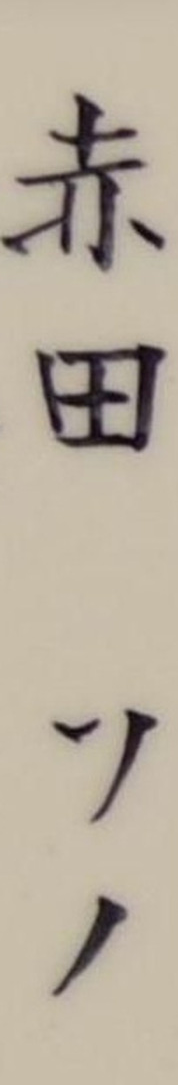赤田ツノ
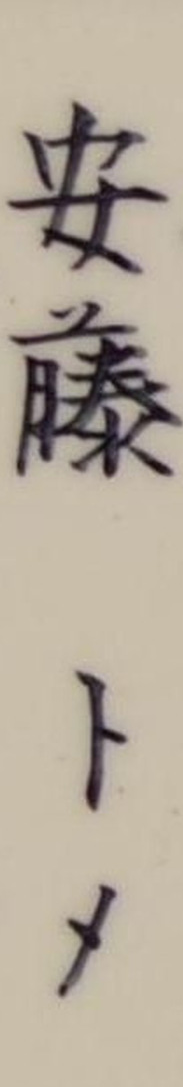安藤トメ
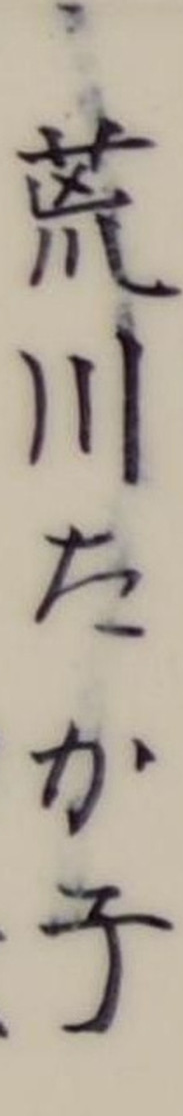荒川たか子
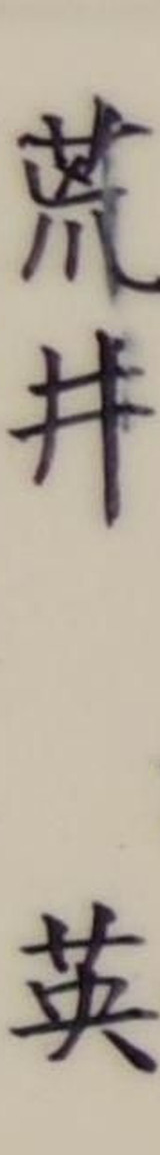荒井英
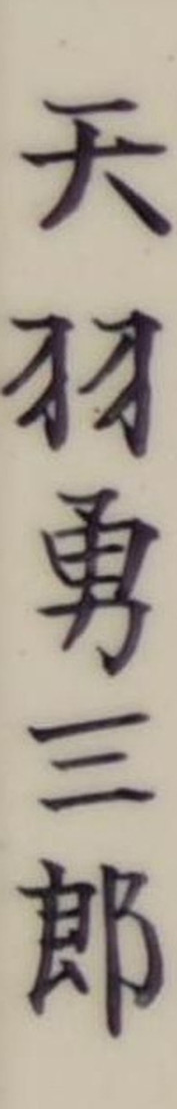天羽勇三郎

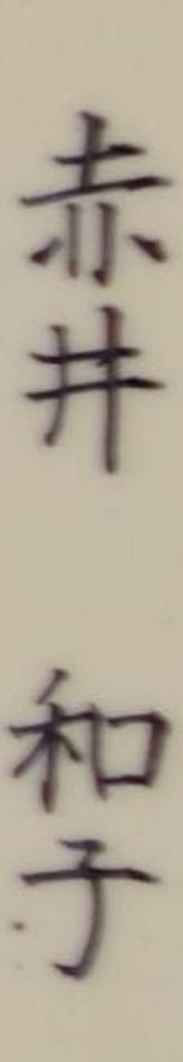赤井和子
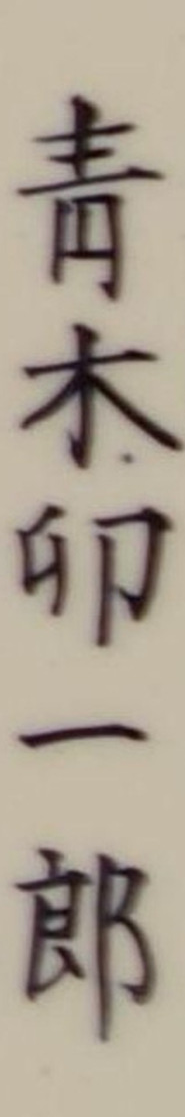青木卯一郎
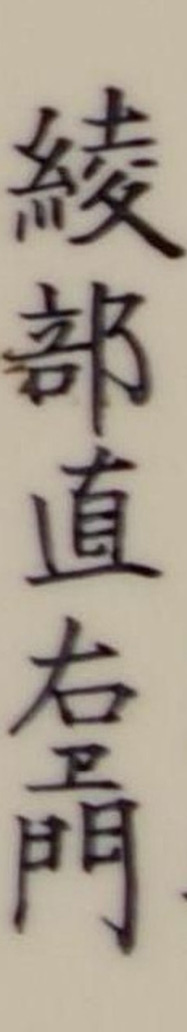綾部直右ヱ門
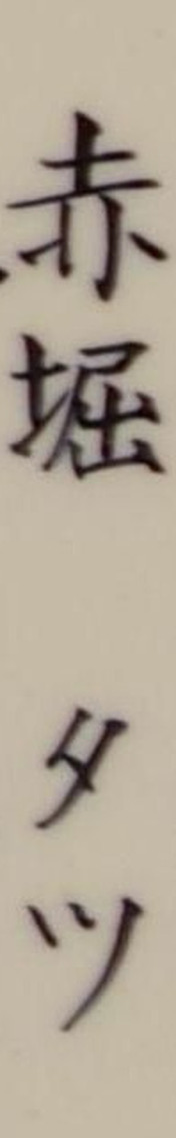赤堀タツ
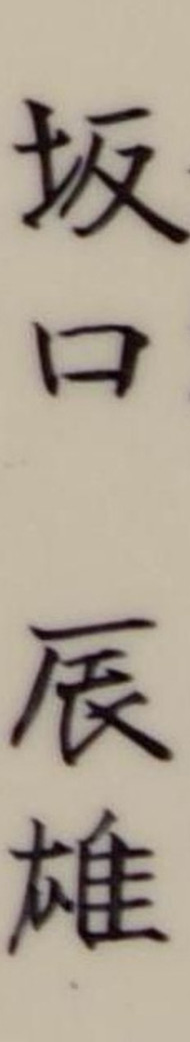坂口辰雄
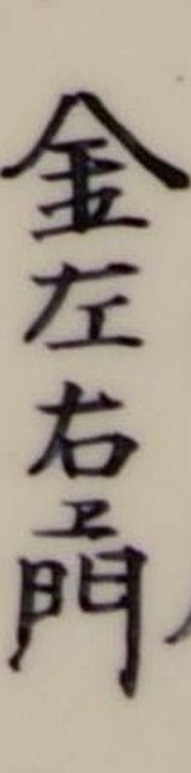金左右エ門
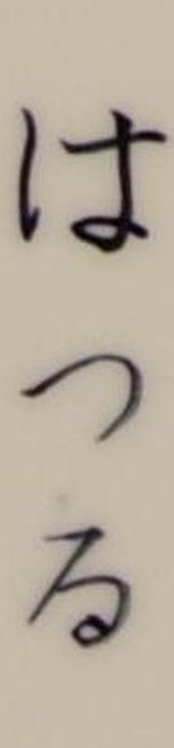はつる

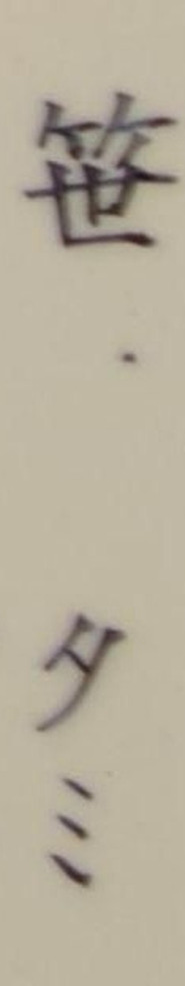笹タミ
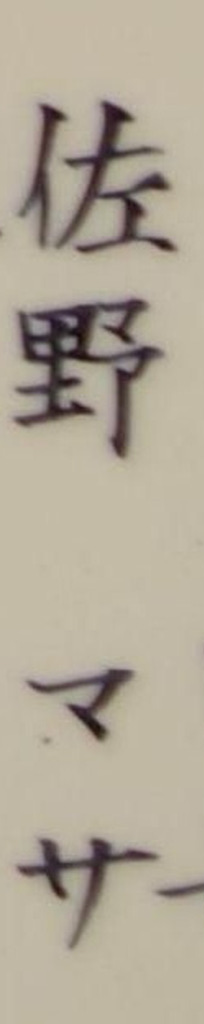佐野マサ
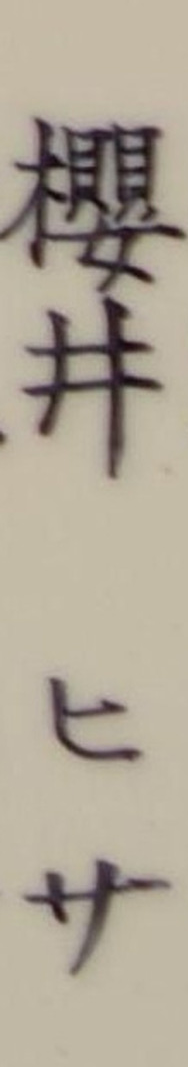桜井ヒサ
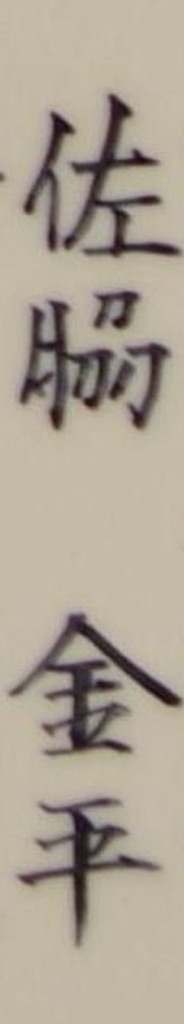佐脇金平
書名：M~S
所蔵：高野山金剛峯寺
